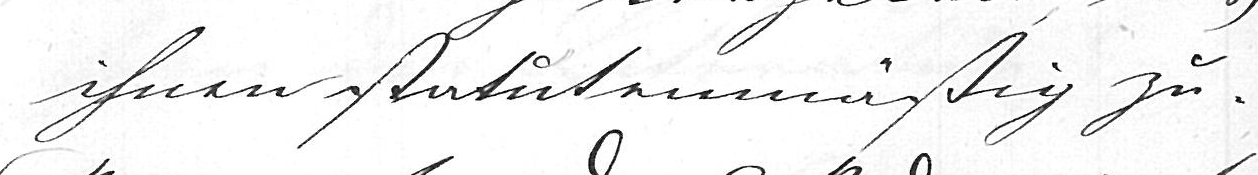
ihnen statutenmäßig zu-
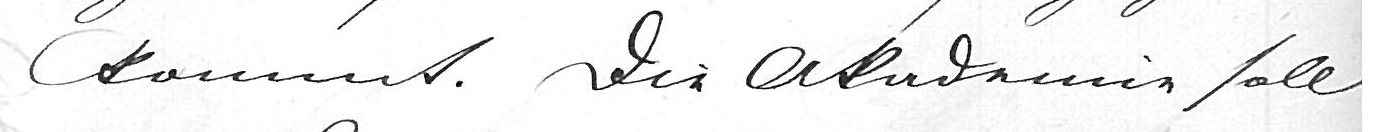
kommt. Die Akademie soll
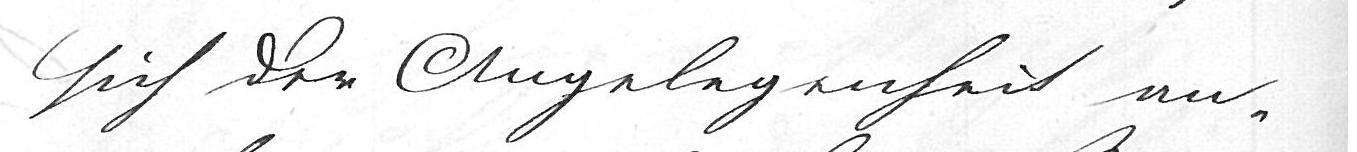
sich der Angelegenheit an-
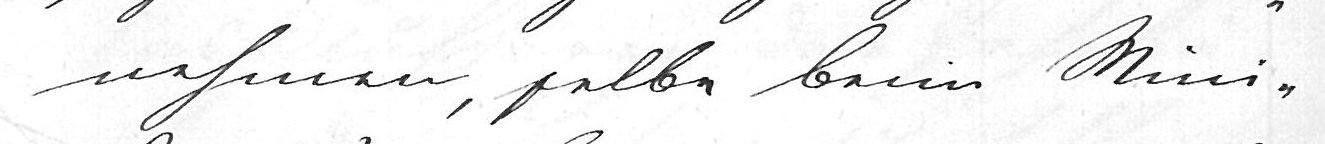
nehmen, selbe beim Mini-
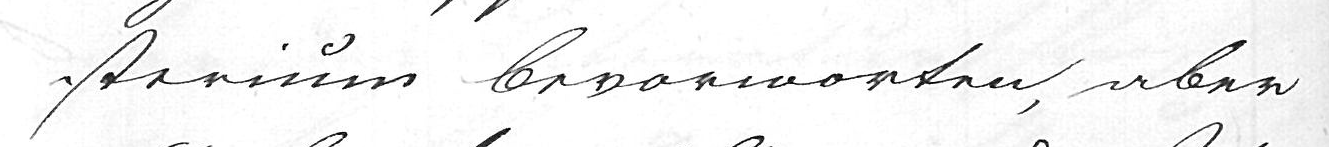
sterium bevorworten, aber
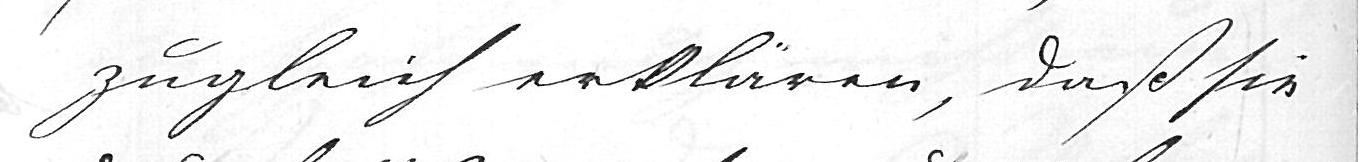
zugleich erklären, daß sie
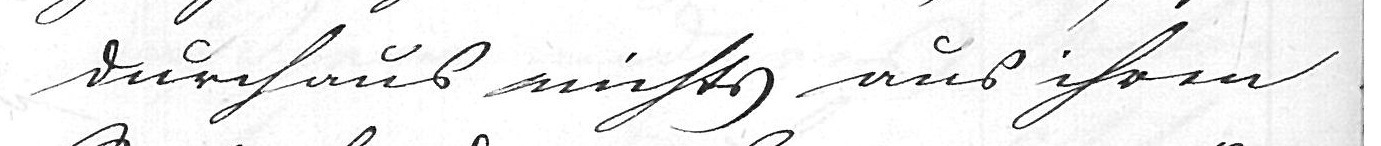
durchaus nichts aus ihren
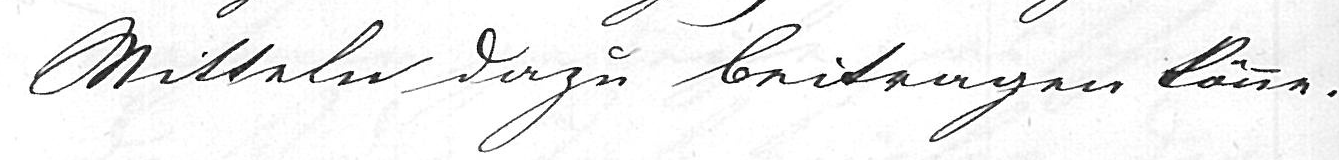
Mitteln dazu beitragen könne.
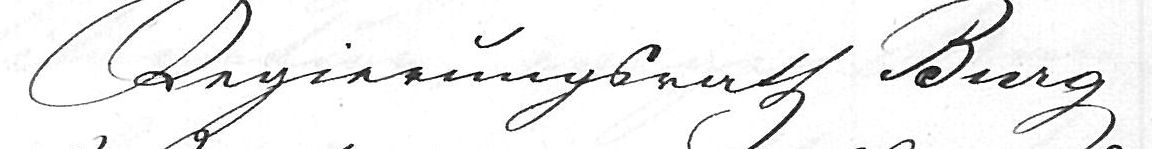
Regierungsrath Burg
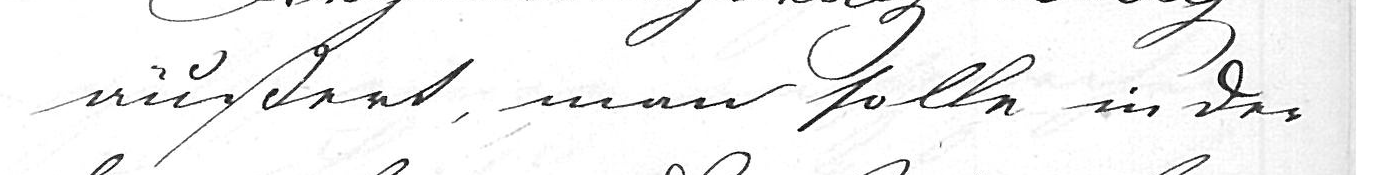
äußert, man solle in der
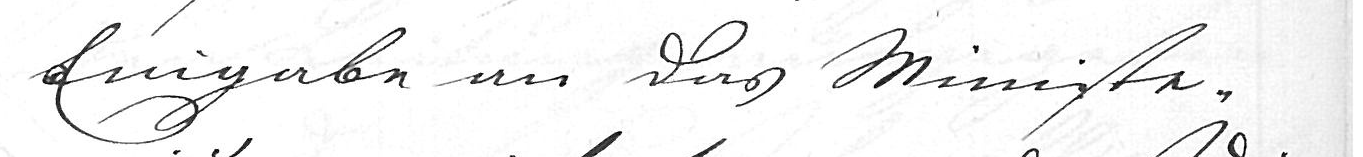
Eingabe an das Ministe-
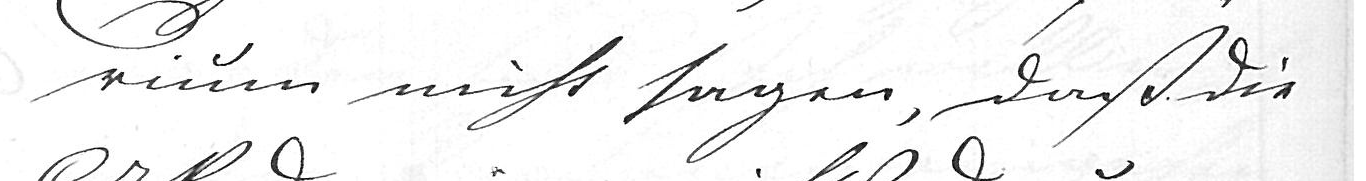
rium nicht sagen, daß die
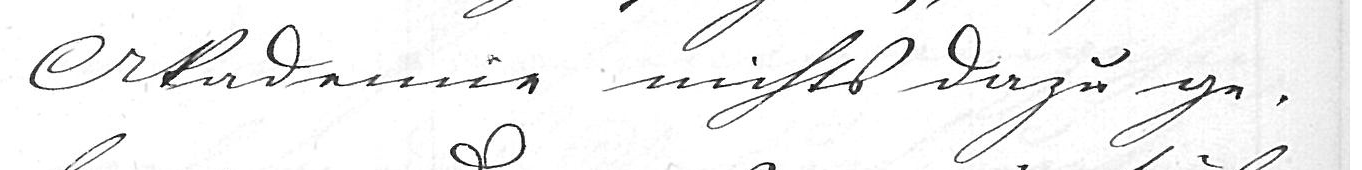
Akademie nichts dazu ge-
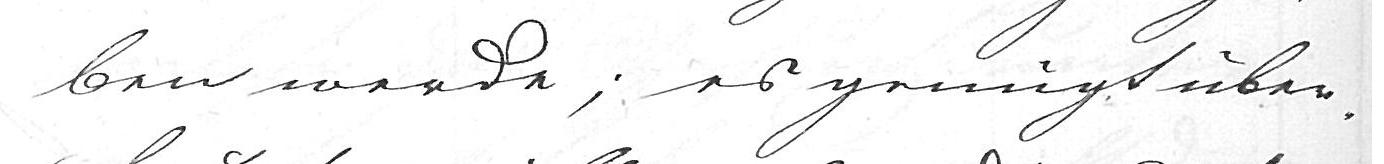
ben werde; es gemügt über-
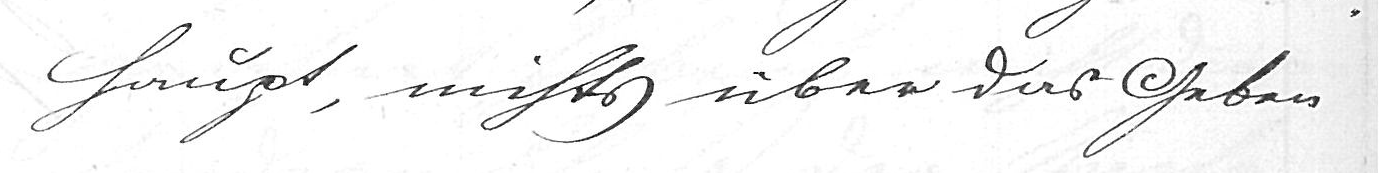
haupt, nichts über das Geben
